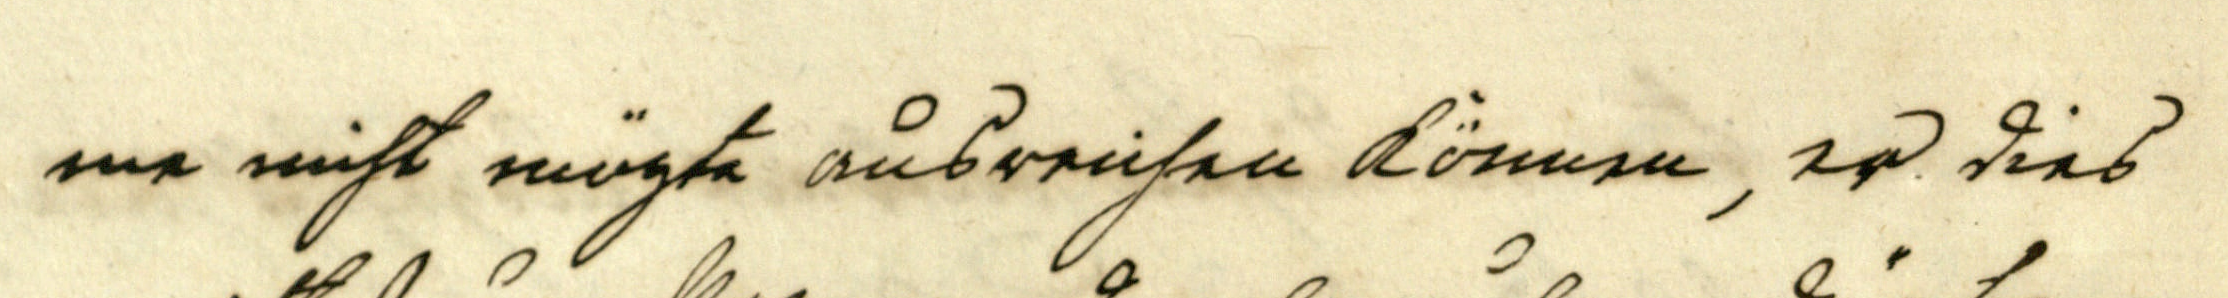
me nicht mögte ausreichen können, er dies
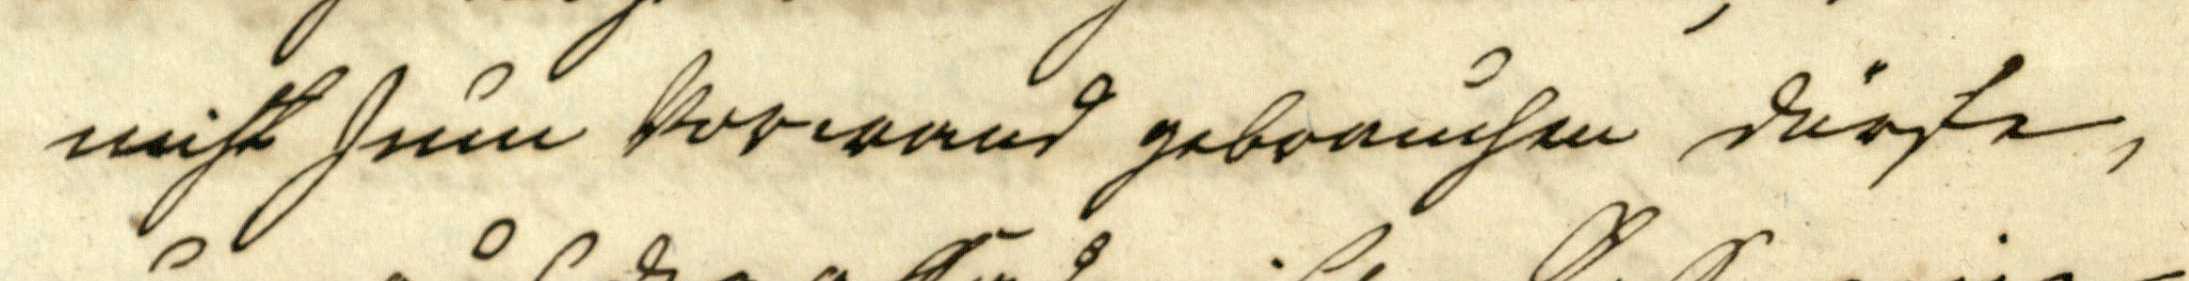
nicht zum Vorwand gebrauchen dürfe,
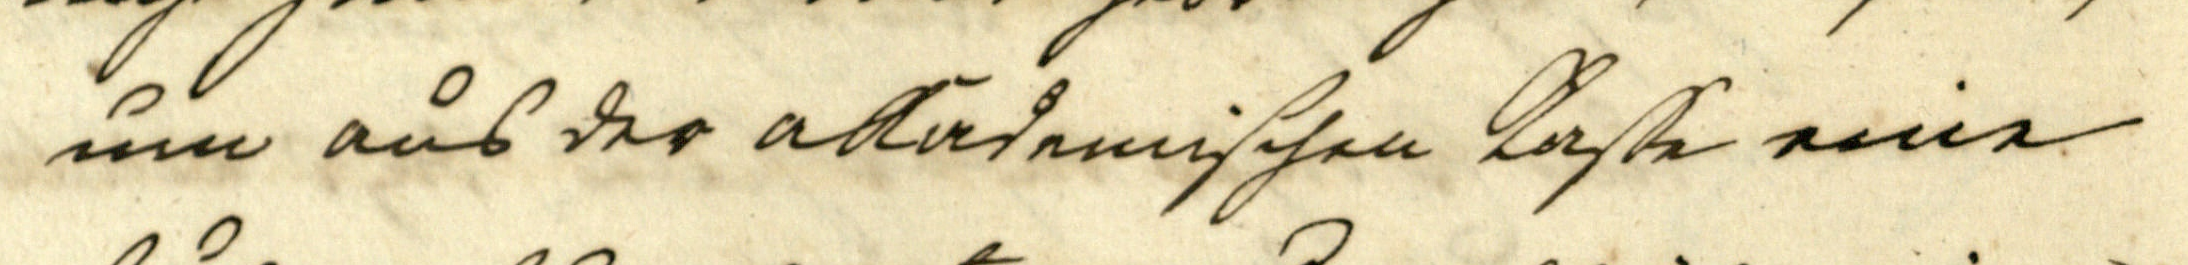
um aus der akademischen Casse eine
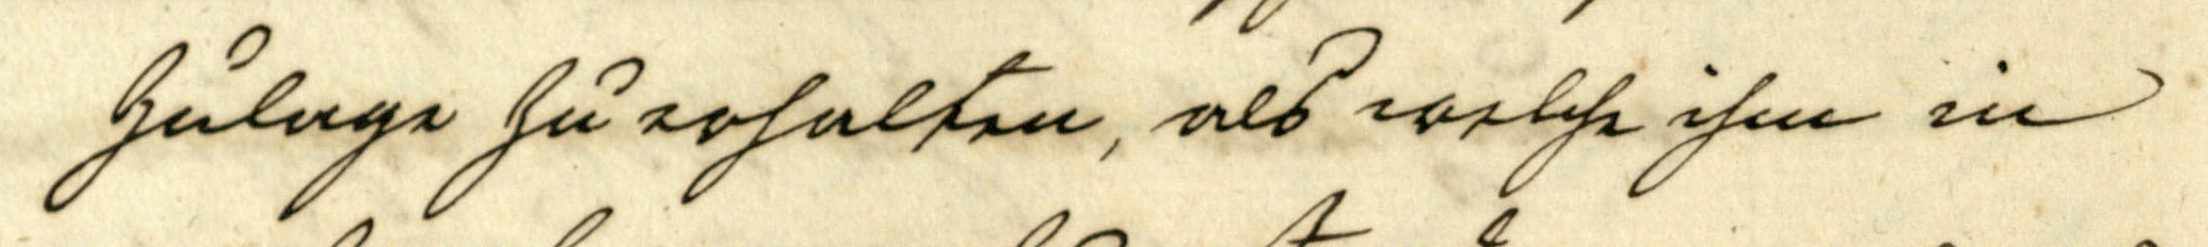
Zulage zu erhalten, als welche ihm in
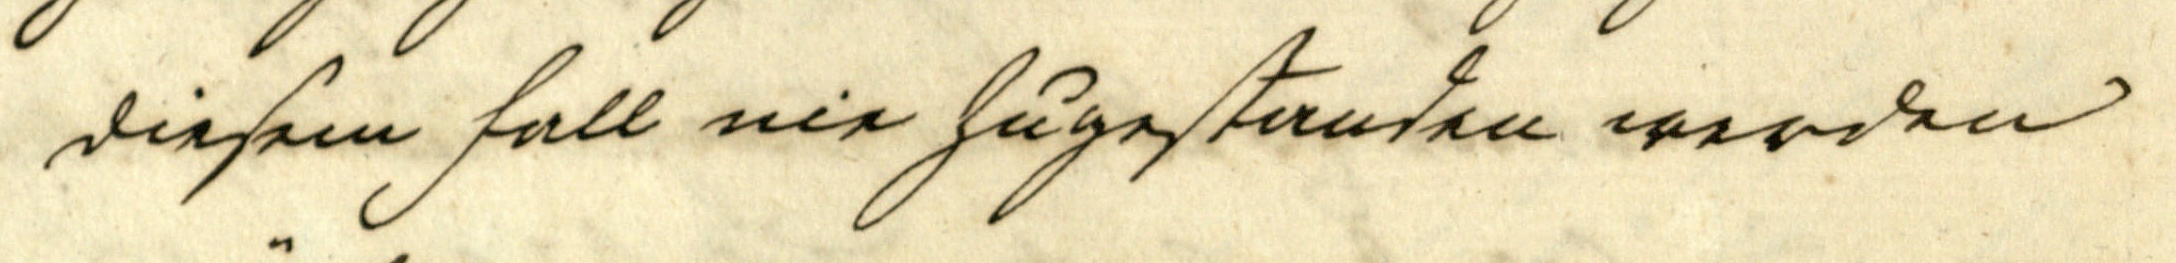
diesem Fall nie zugestanden werden
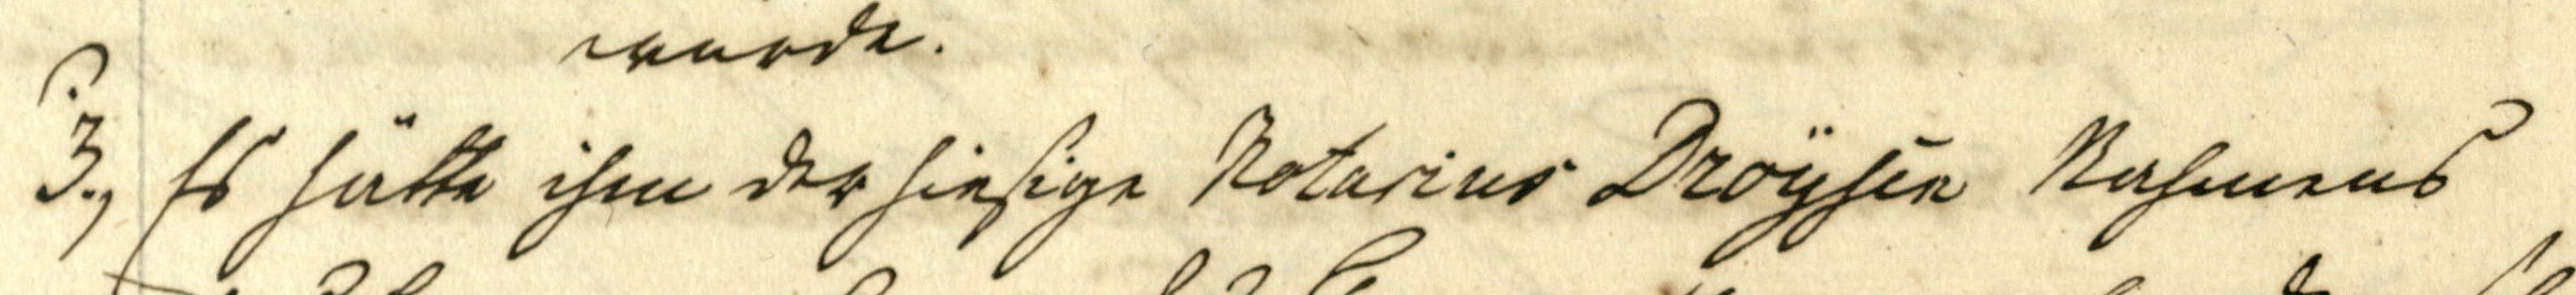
3., Es hätte ihm der hiesige Notarius Droÿsen Nahmens
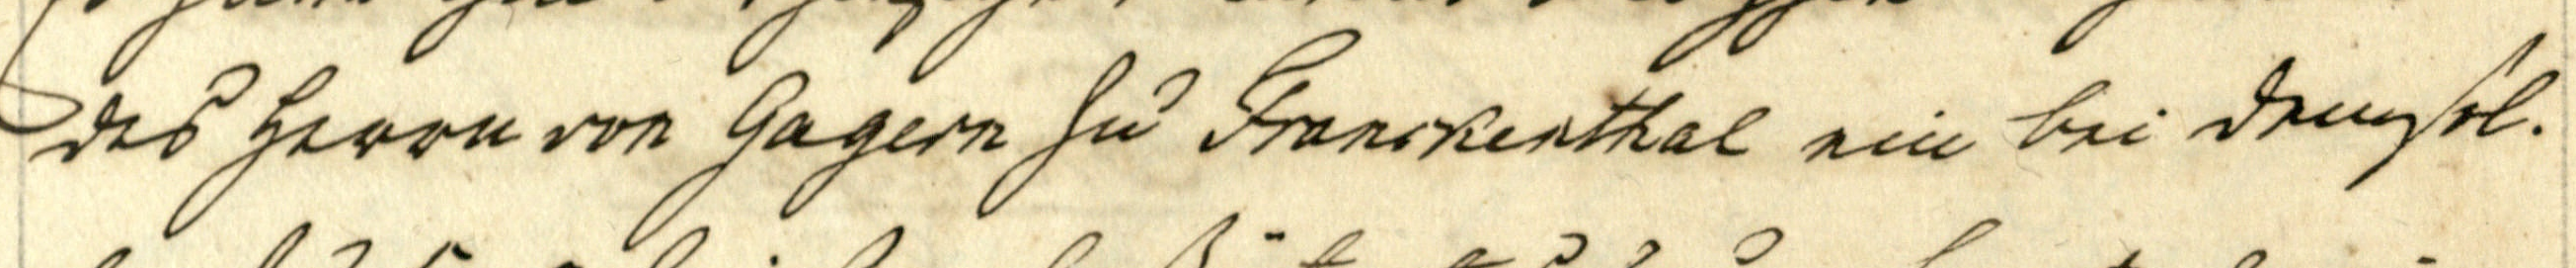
des Herrn von Gagern zu Franckenthal ein bei demsel¬
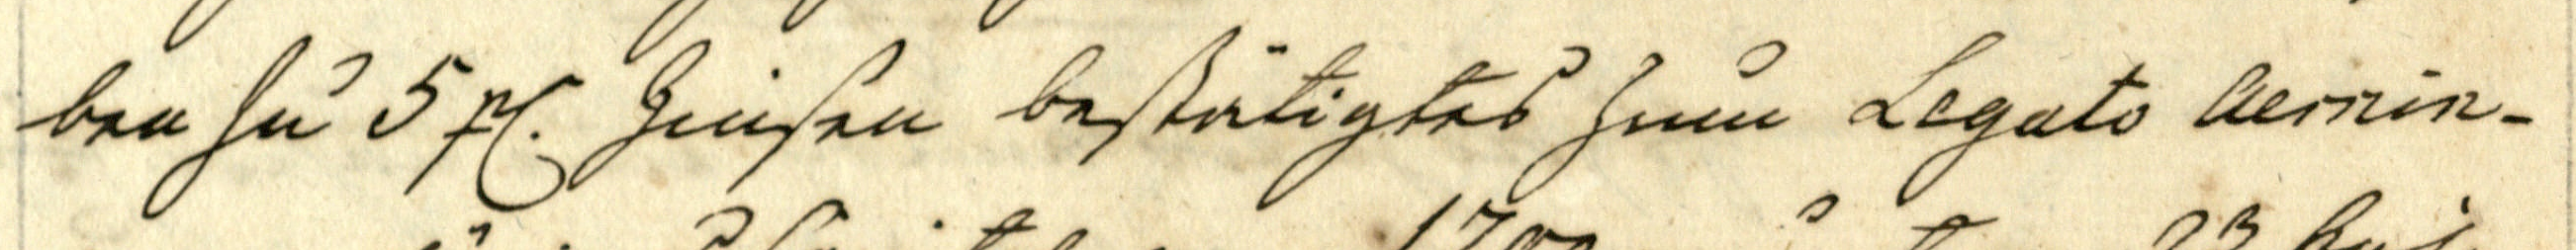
ben zu 5 P. Zinsen bestätigtes zum Legato Aemin¬
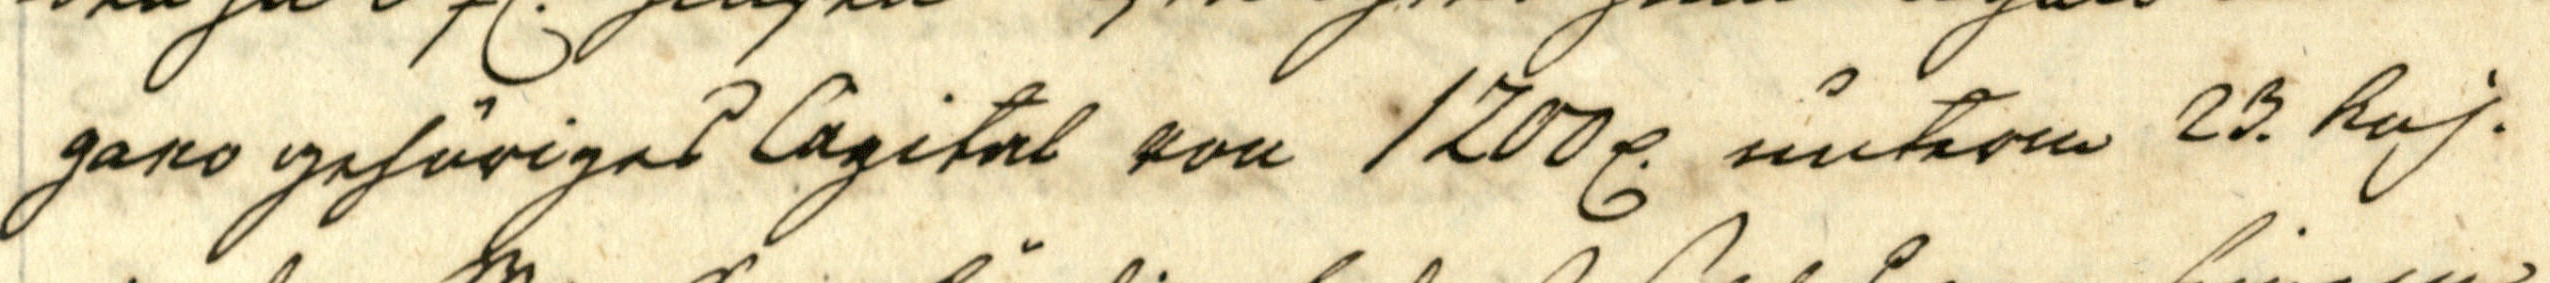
gano gehöriges Capital von 1200 l. unterm 23. huj.
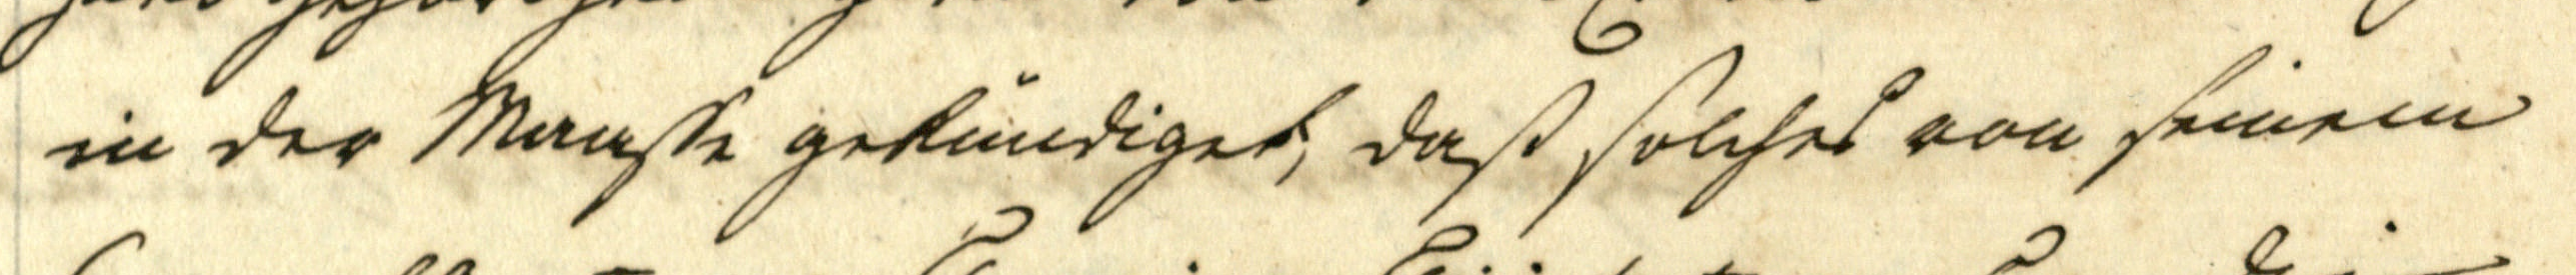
in der Maasse gekündiget, daß solches von seinem
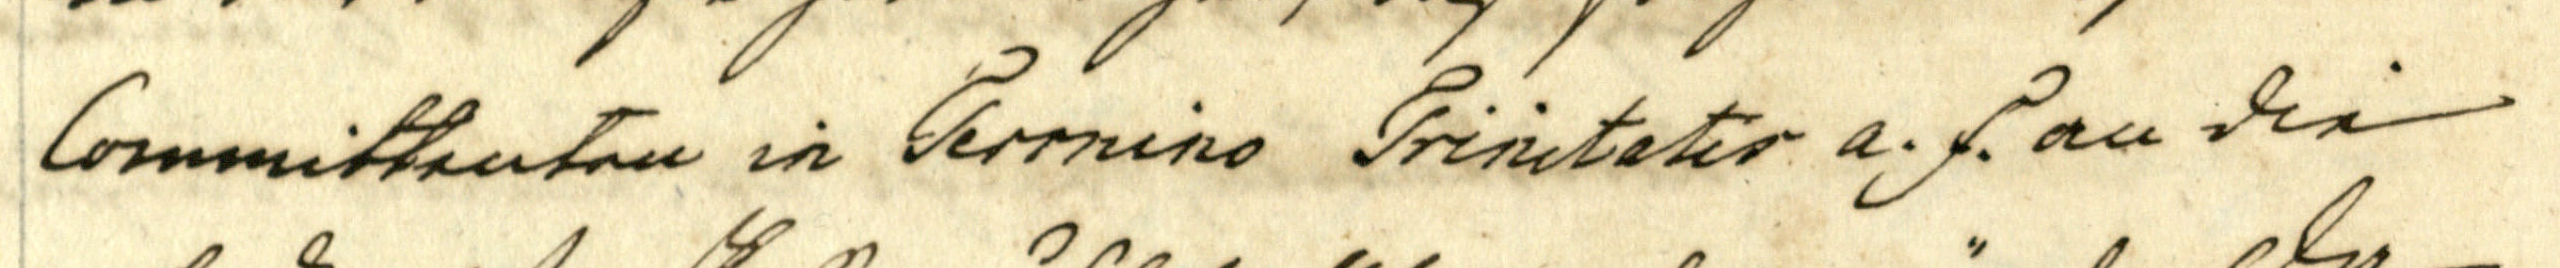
Committenten in Termino Trinitatis a. f. an die
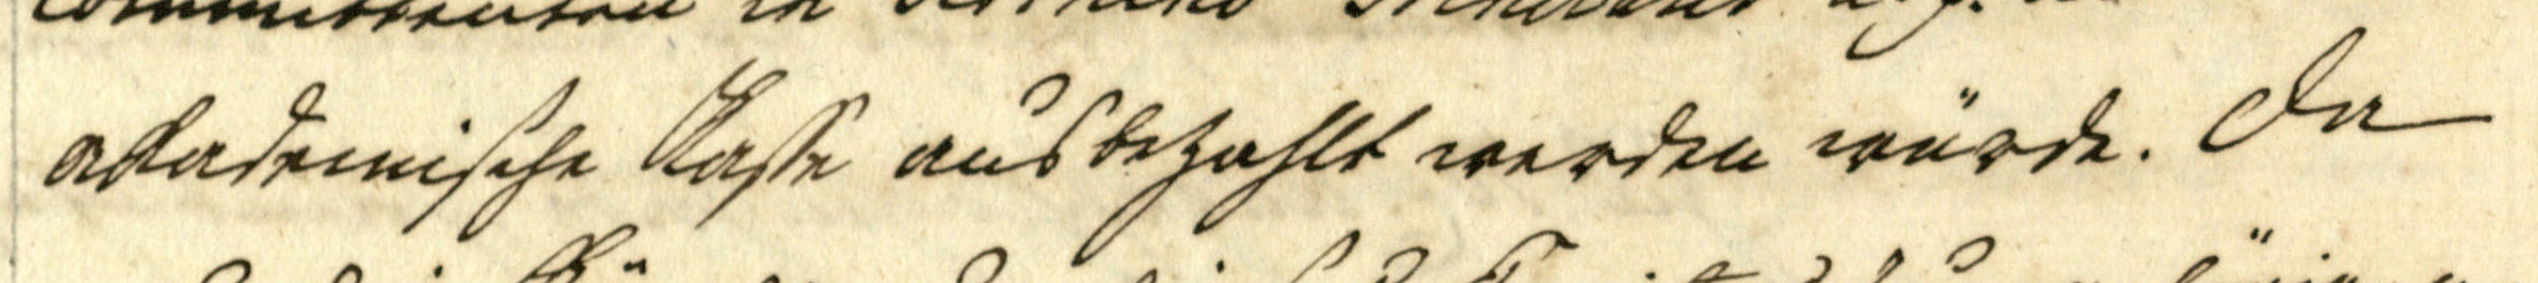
akademische Casse ausbezahlt werden würde. Da
